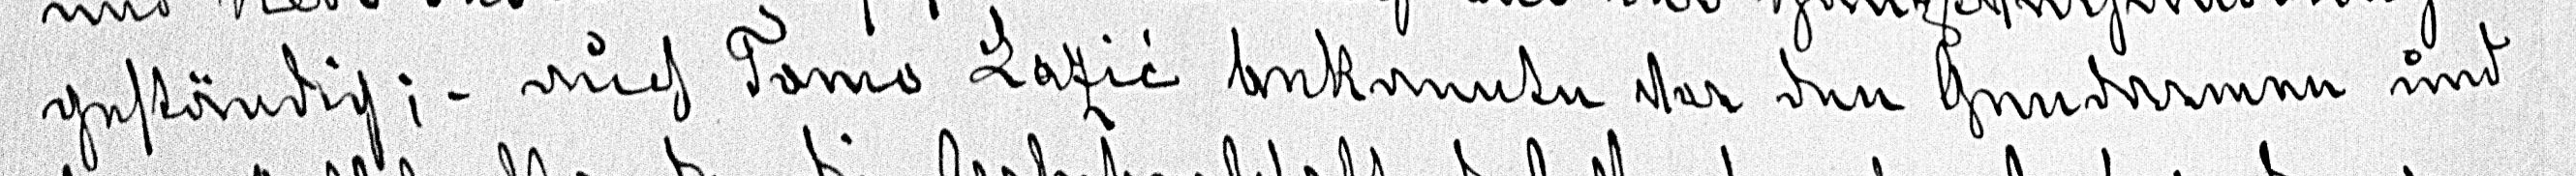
geständig; - auch Tomo Lazić bekannte vor den Gendarmen und
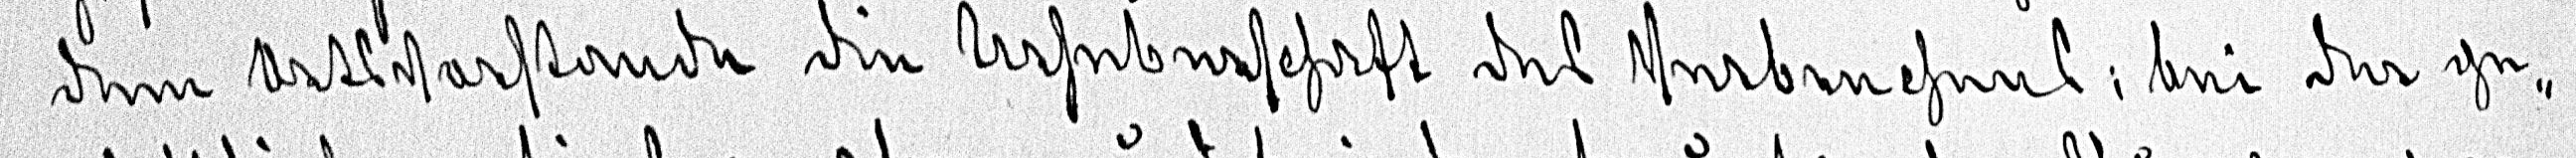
dem Ortsvorstande die Urheberschaft des Verbrechens; bei der ge¬
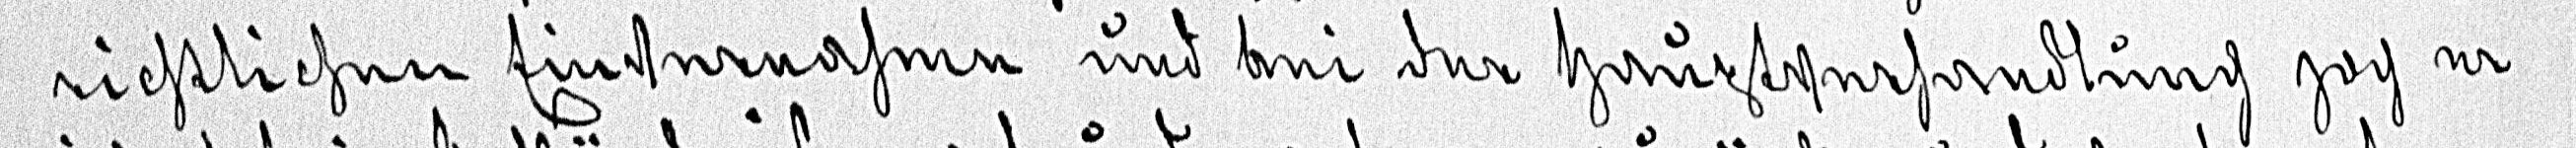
richtlichen Einvernahme und bei der Hauptverhandlung zog er
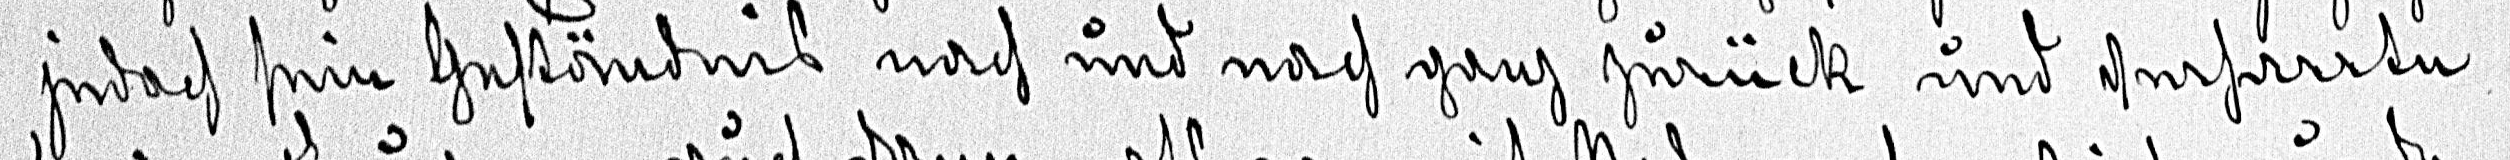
jedoch sein Geständnis nach und nach ganz zurück und verharrte
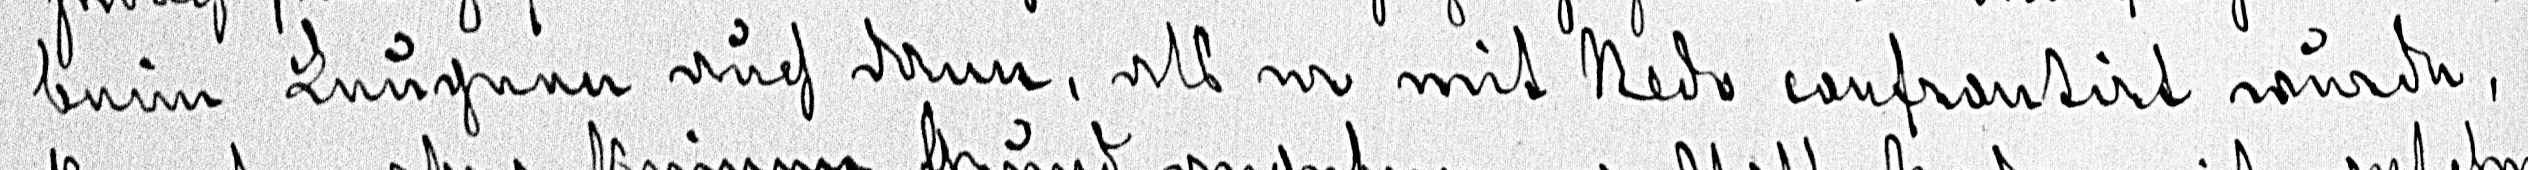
beim Leugnen auch dann, als er mit Nedo confrontirt wurde,
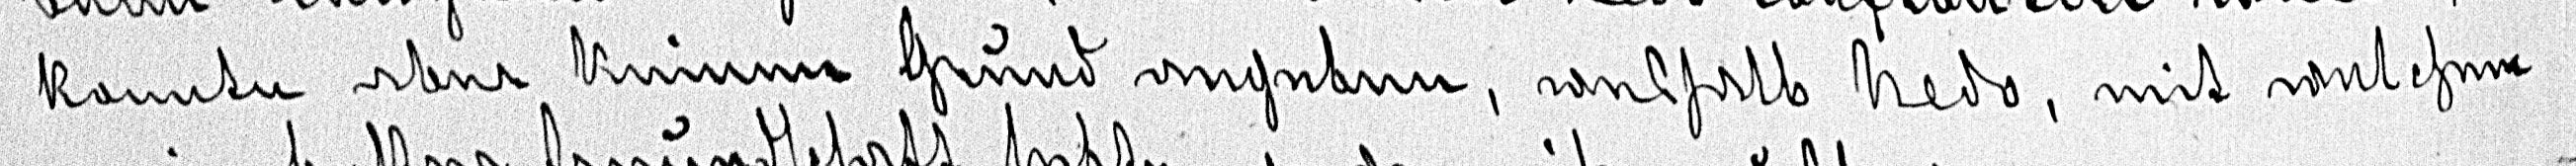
konnte aber keinen Grund angeben, weshalb Nedo, mit welchen
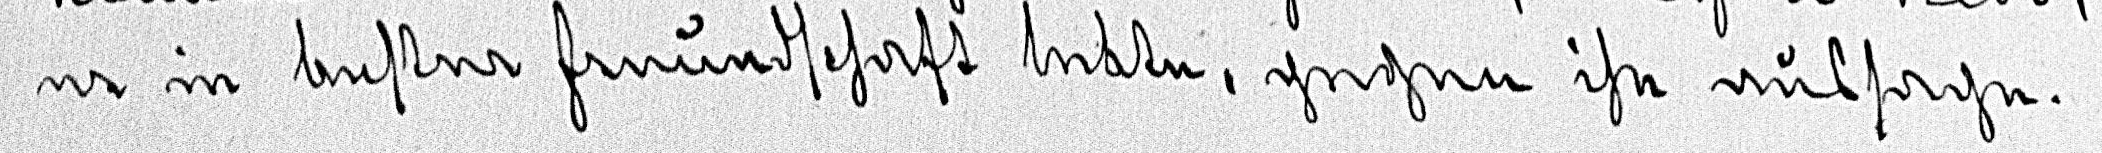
er in bester Freundschaft lebte, gegen ihr aussage.
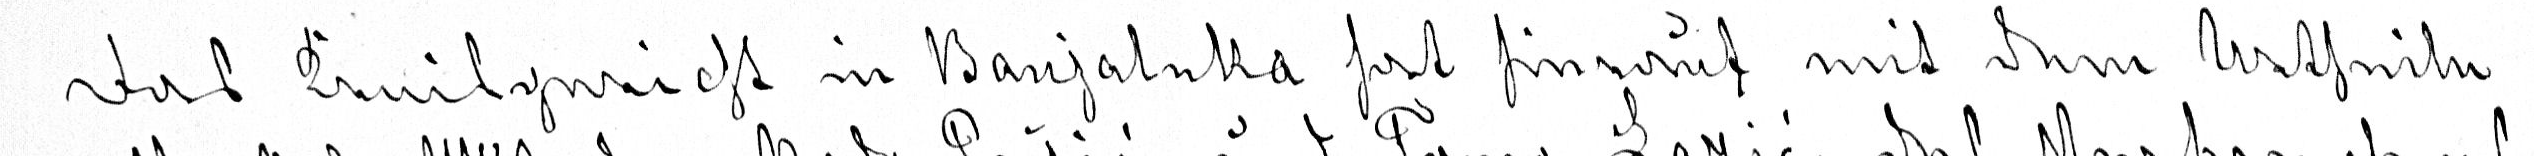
Das Kreisgewicht in Banjaleka hat hierauf mit dem Urtheile
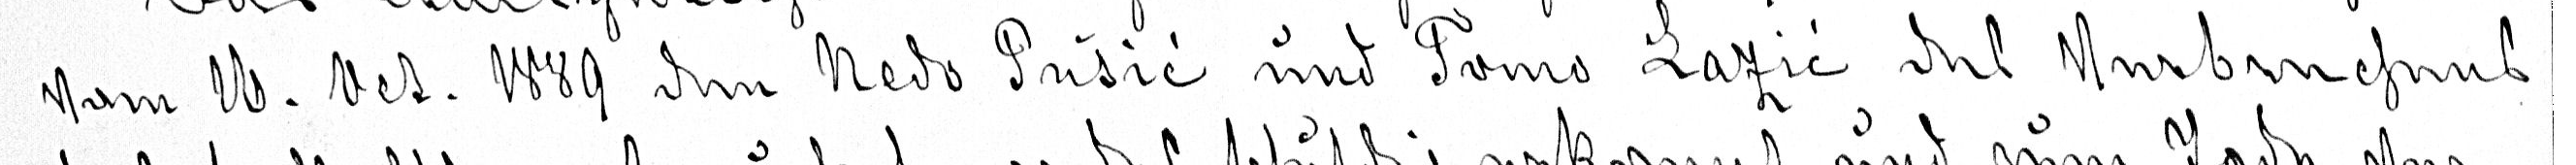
vom 20. Oct. 1889 den Nedo Pusić und Tomo Lazić des Verbrechens
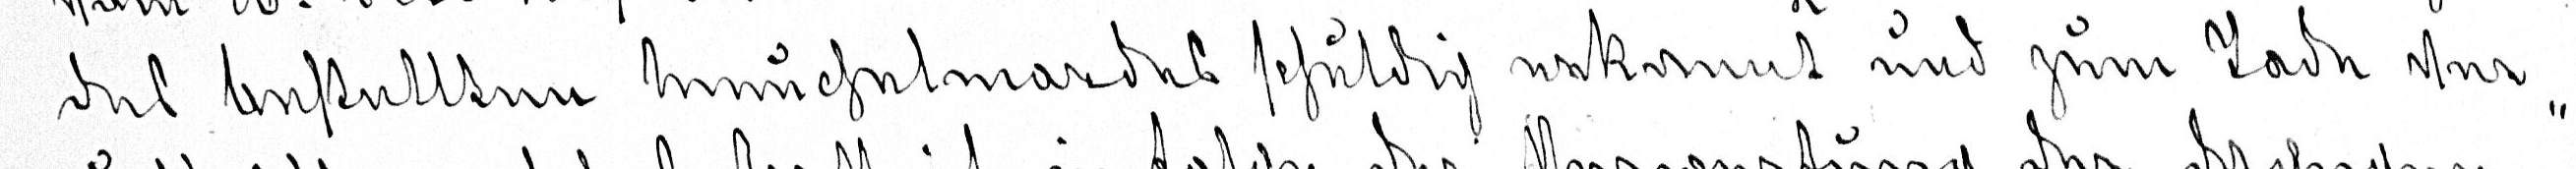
des bestellten Meuchelmordes schuldig erkannt und zum Tode ver¬
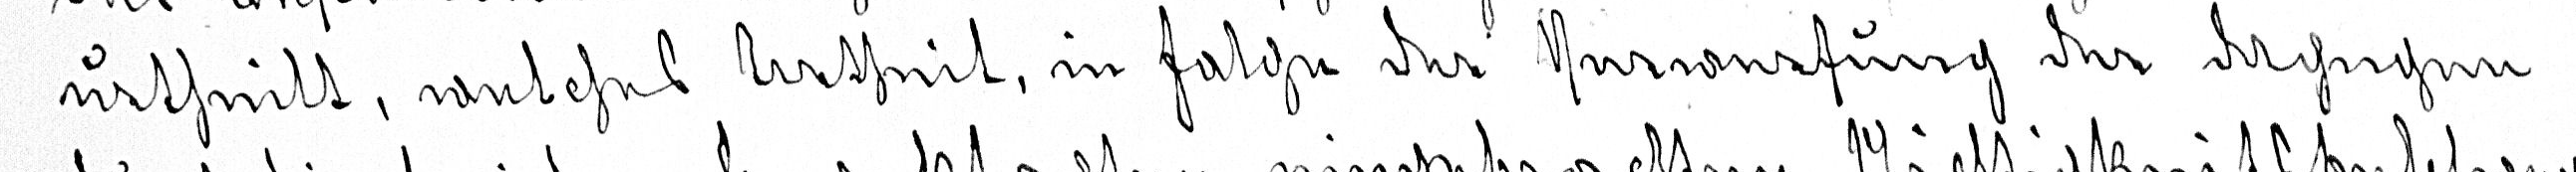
urtheilt, welches Urtheil, in Folge der Verwerfung der dagegen
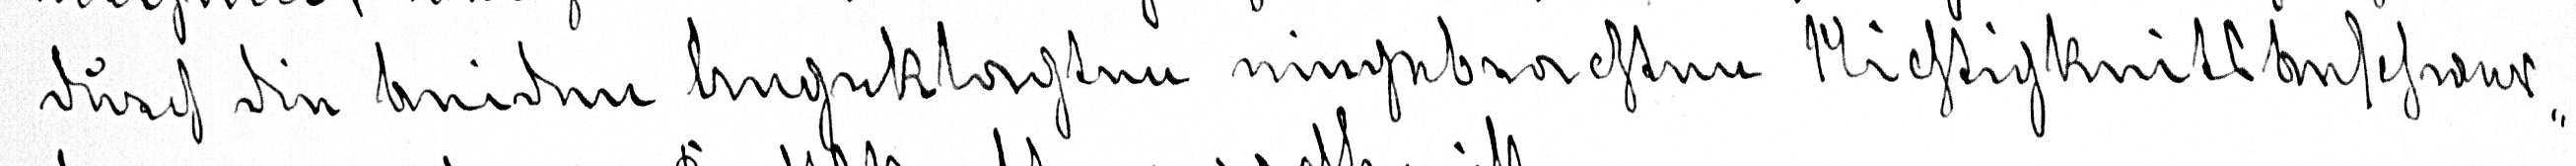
durch die beiden Angeklagten eingebrachten Nichtigkeitsbeschwer¬
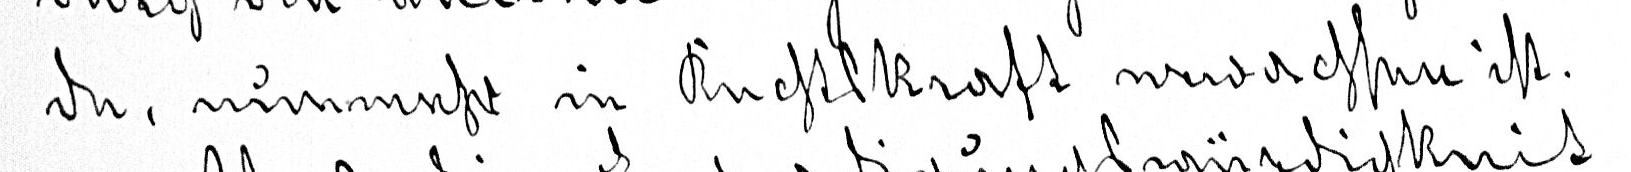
de, nunmehr in Rechtskraft erwachsen ist.
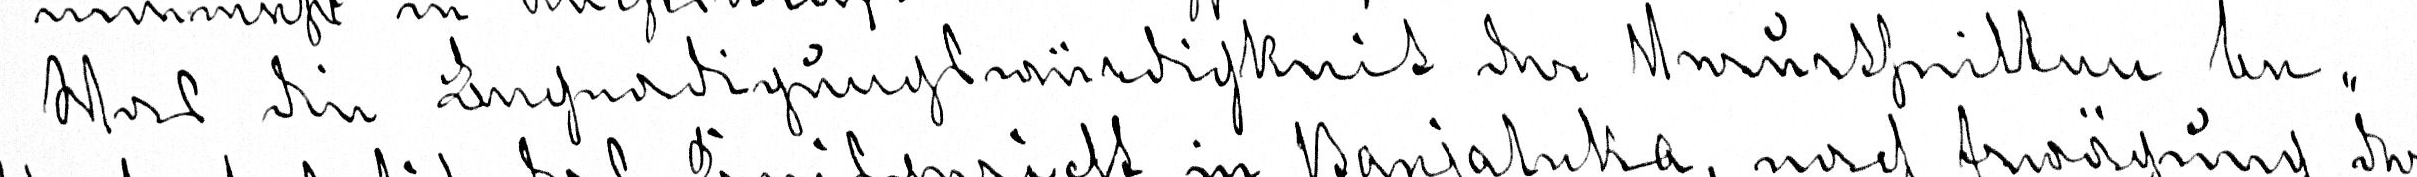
Was die Begnadigungswürdigkeit der Verurtheilten be¬
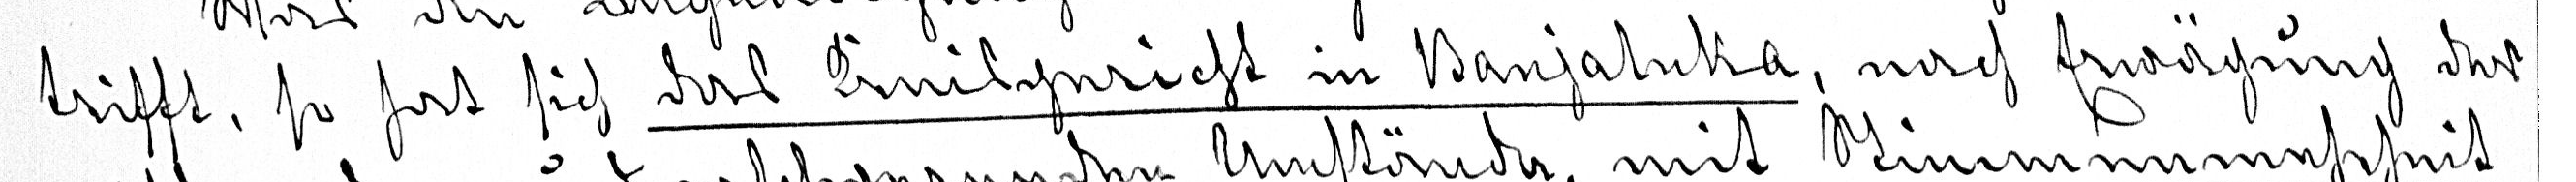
trifft, so hat sich das Kreisgericht in Banjateka, nach Erwägung der
